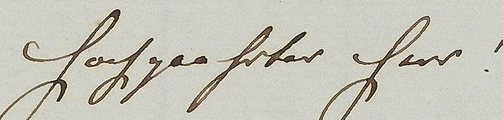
Hochgeehrter Herr!
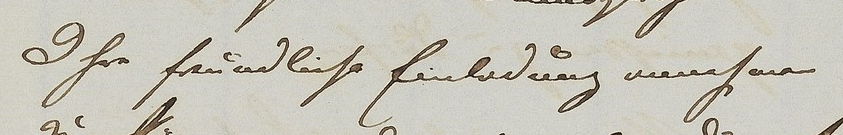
Ihre freundliche Einladung annehmen
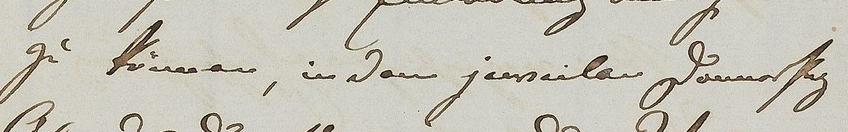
zu können indem jeweilen Donnerstag
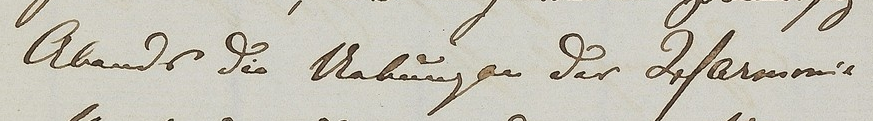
Abends die Uebungen der Harmonie
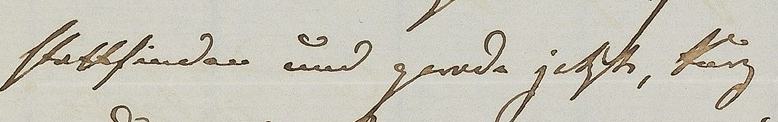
stattfinden und gerade jetzt, kurz
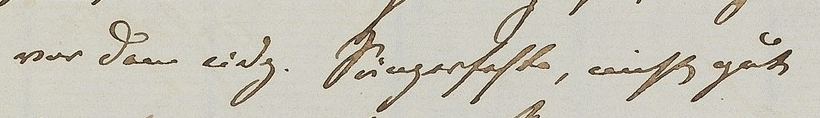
vor dem eidg. Sängerfeste, nicht gut
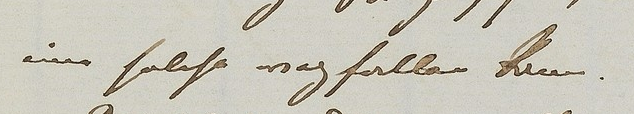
eine solche wegfallen kann.
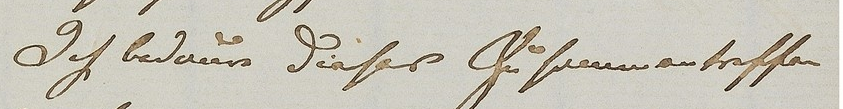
Ich bedaure dieses Zusammentreffen
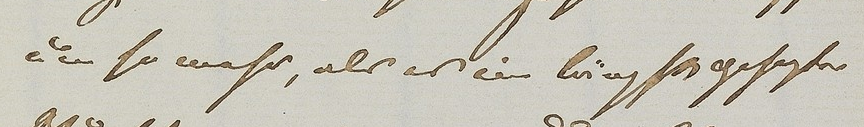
um so mehr, als es ein längst gehegter
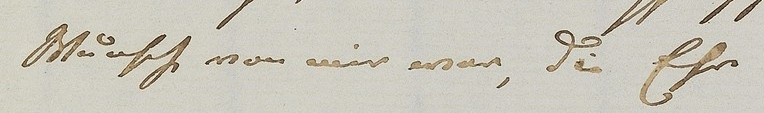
Wunsch von mir war, die Ehre
